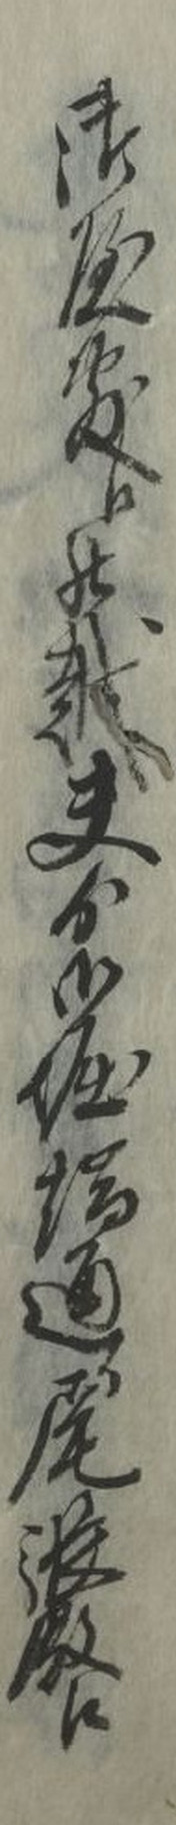御屋敷え罷越夫ゟ御堀端通り尾張殿え
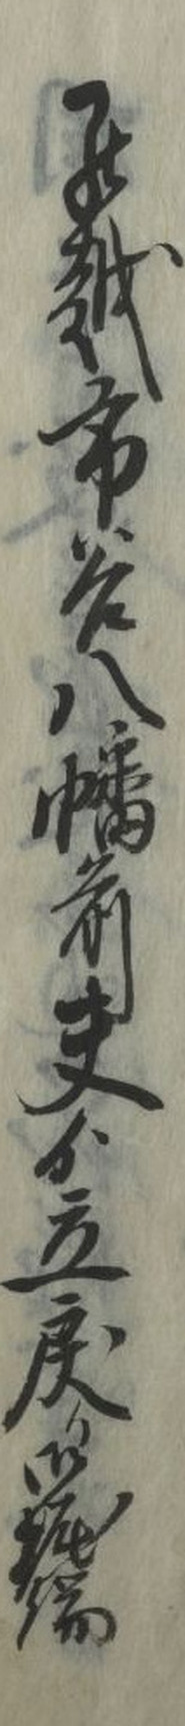罷越市谷八幡前夫ゟ立戻り御堀端
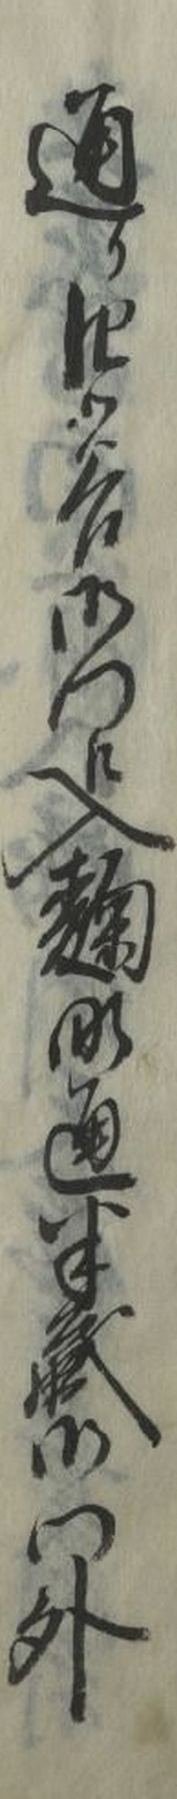通り四ツ谷御門え入麹町通半蔵御門外
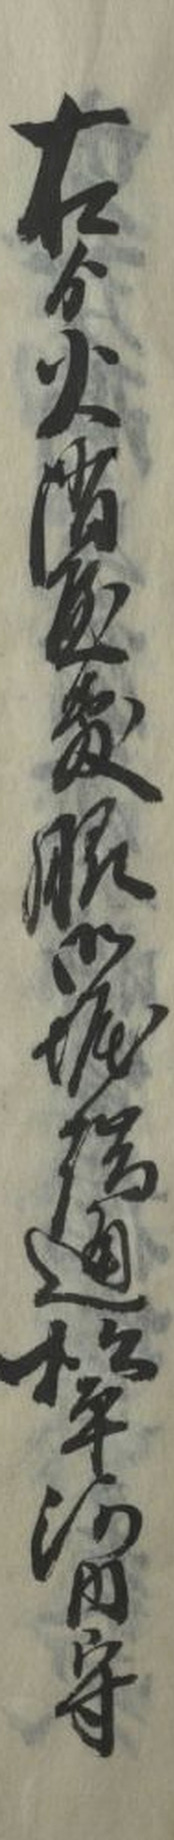右ゟ火消屋敷脇御堀端通松平河内守
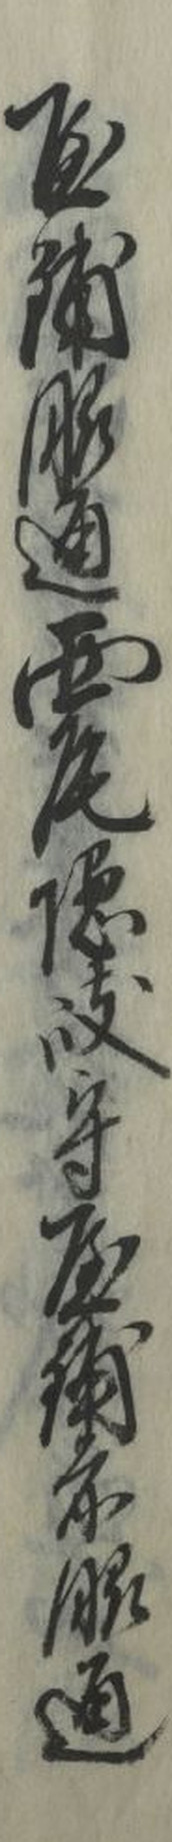屋鋪脇通西尾隠岐守屋鋪前脇通
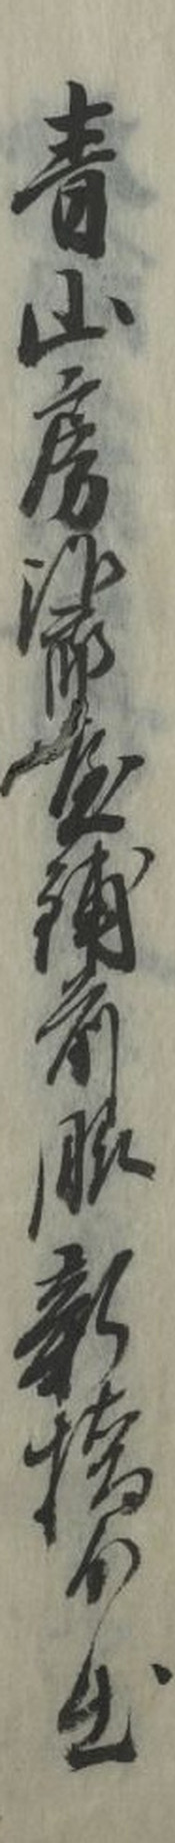青山房次郎屋鋪前脇新橋ゟ出
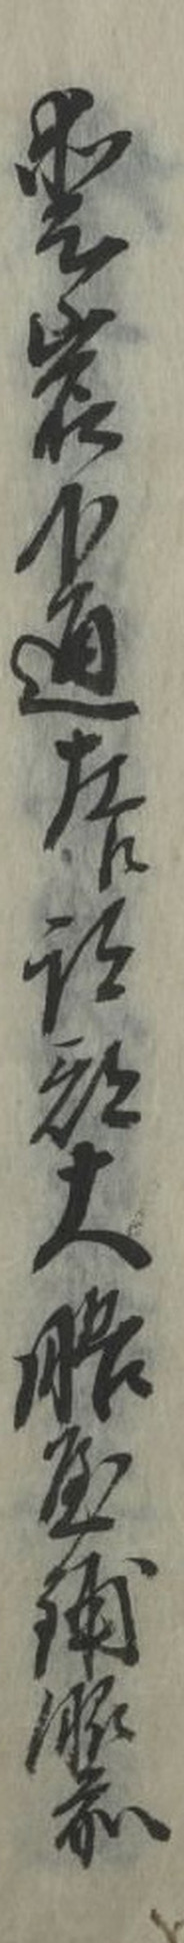愛宕下通左え阿部大膳屋鋪脇前
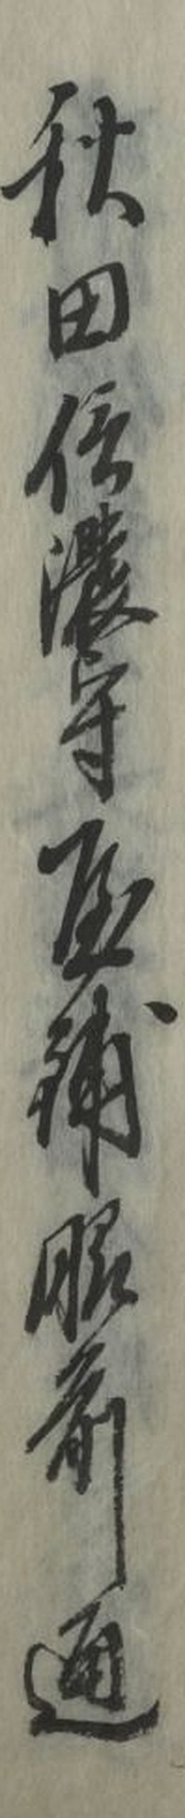秋田信濃守屋鋪脇前通

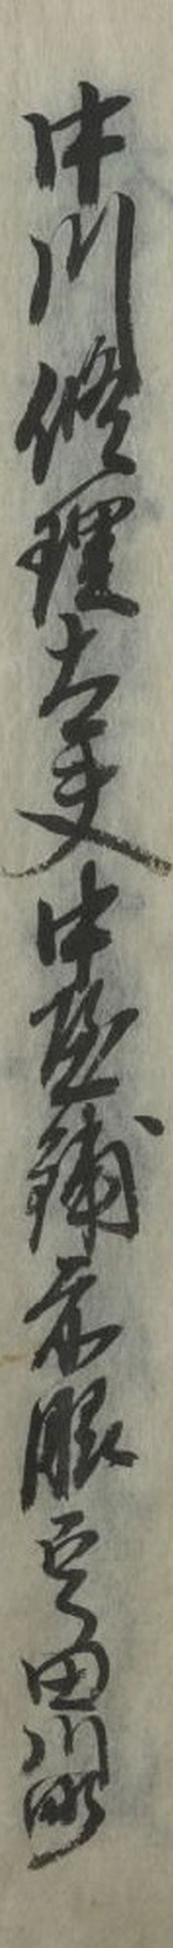中川修理太夫中屋鋪前脇宇田川町
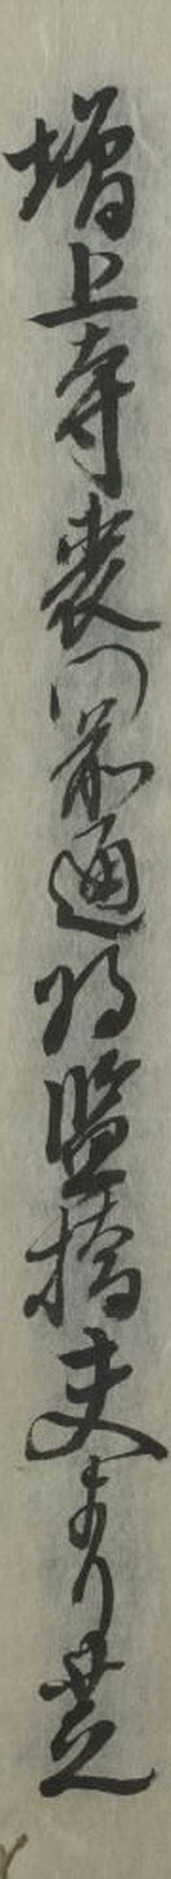増上寺表門前通将監橋夫より芝
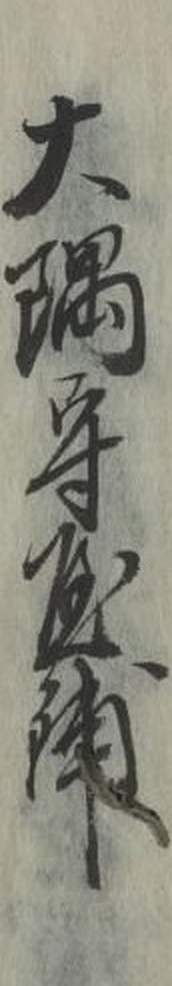大隅守屋鋪
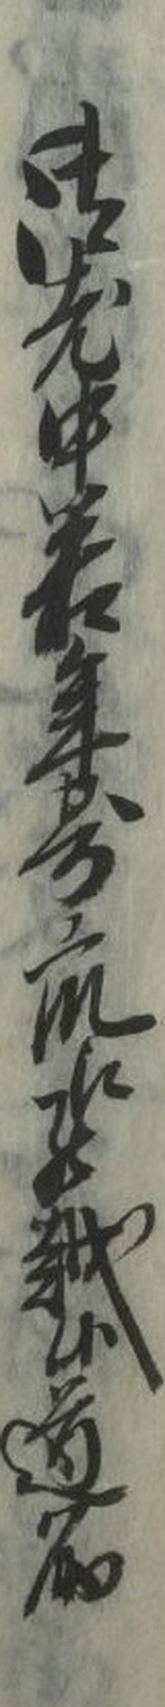御老中若年寄衆え罷越候道筋
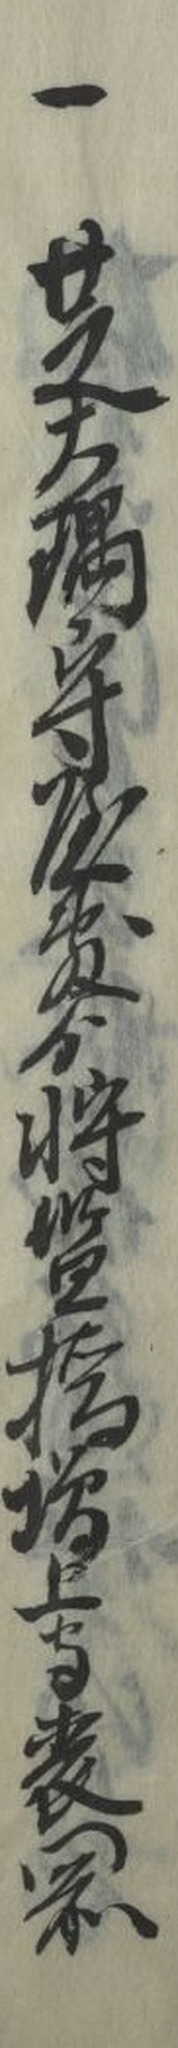一芝大隅守屋敷ゟ将監橋増上寺表門前
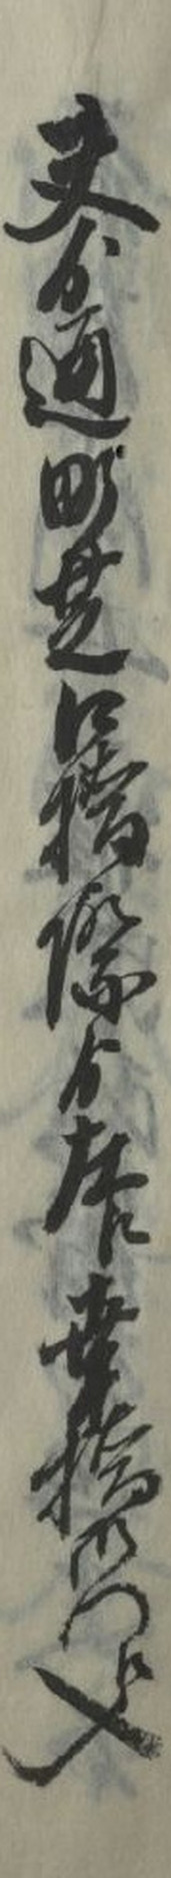夫ゟ通町芝口橋際ゟ左え幸橋御門え入
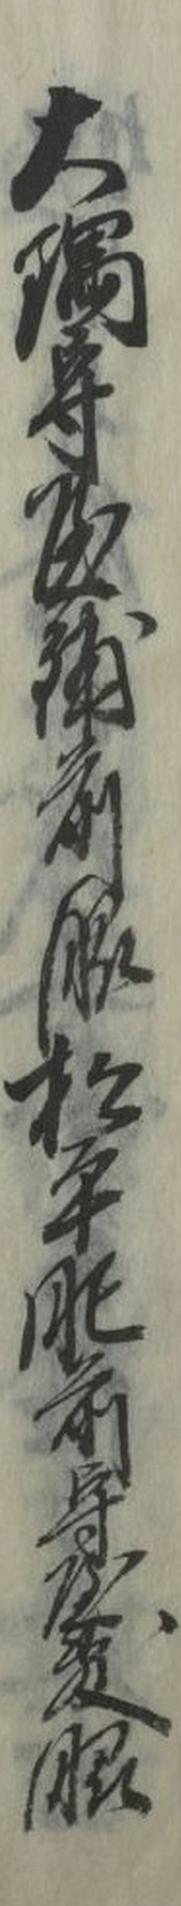大隅守屋鋪前脇松平肥前守屋敷脇
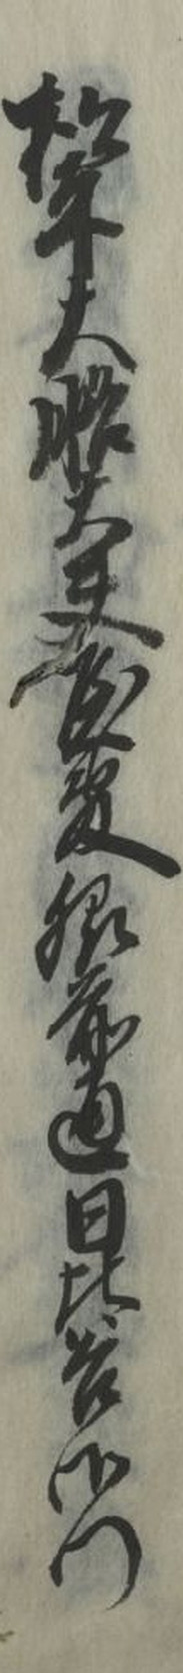松平大膳大夫屋敷脇前通日比谷御門
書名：天保三壬辰年・琉球人参府・弐朱吹立御触写
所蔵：University of the Ryukyus Library
